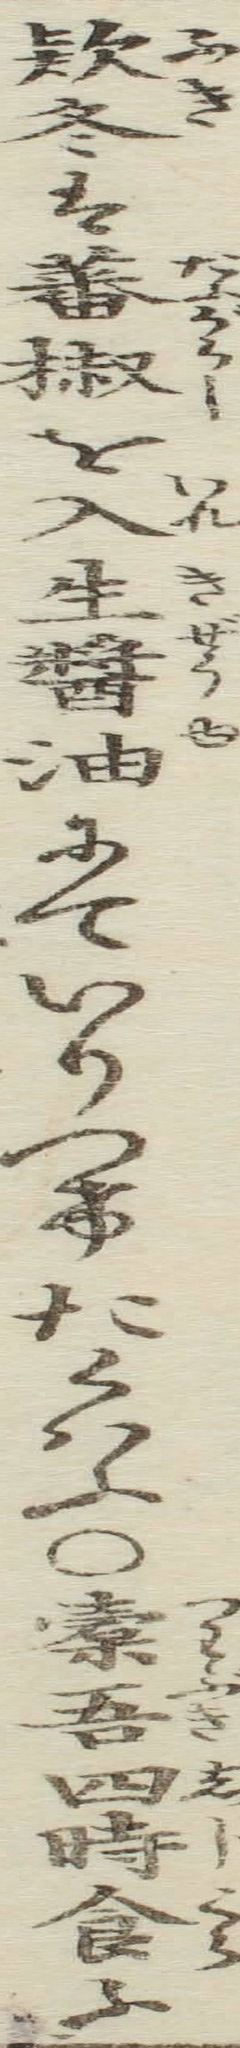欵冬は蕃椒を入生醤油にていりつけたくはふ○槖吾四時食ふ
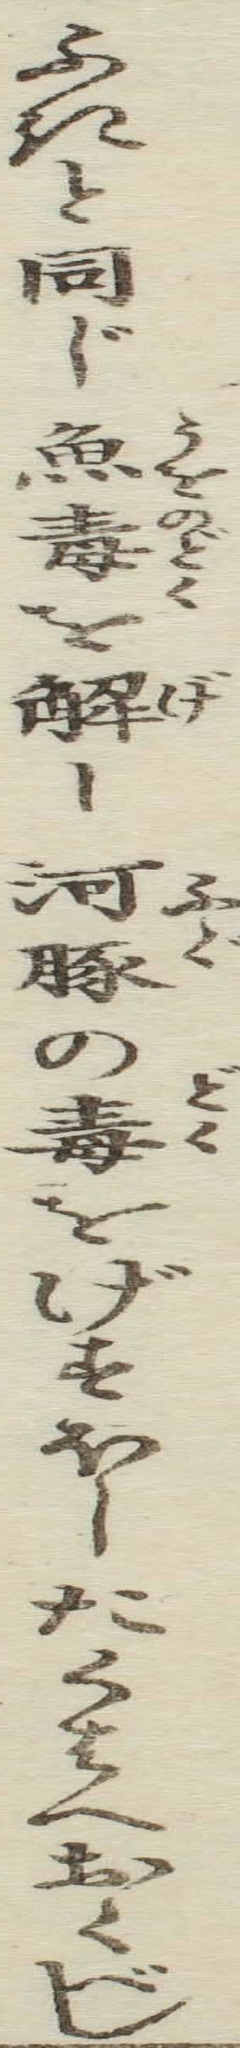ふきと同じ魚毒を解し河豚の毒をげすほしたくはへおくべし
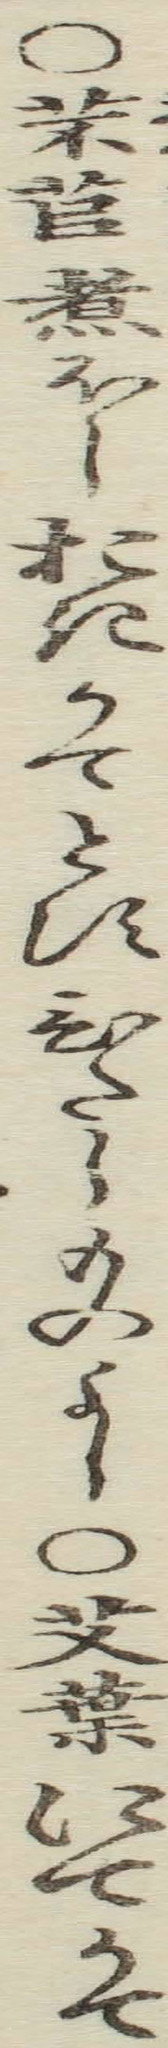○芣苢煮ほしおきかてとすひたしものよし○艾葉にてかて
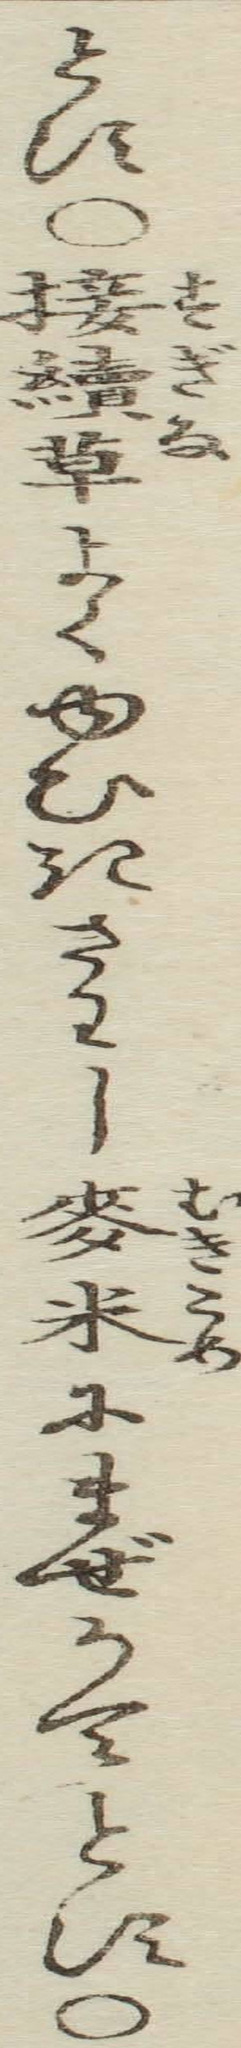とす○接続草よくゆひきさわし麦米にまぜかてとす○

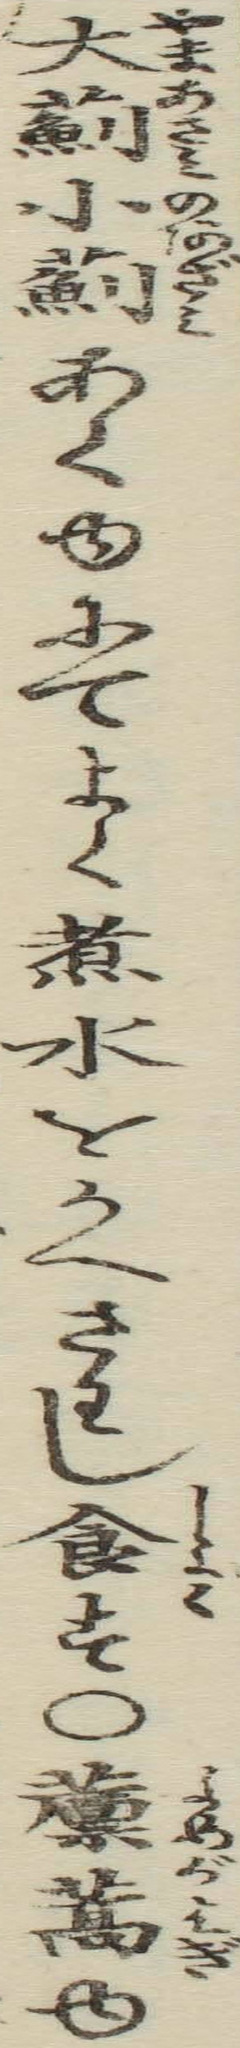大薊小薊あくゆにてよく煮水をかへさわし食す○䕲蒿ゆ
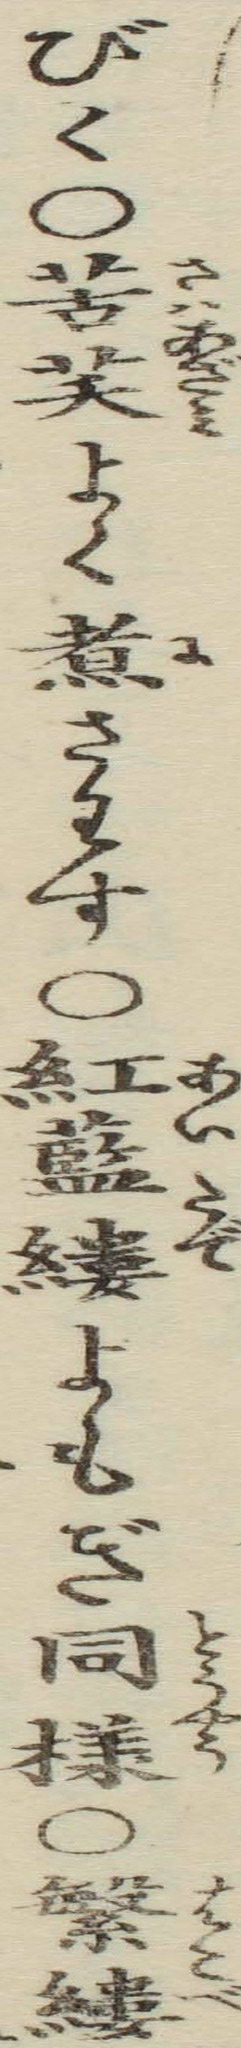びく○苦芺よく煮さわす○紅藍縷よもぎ同様○繁縷
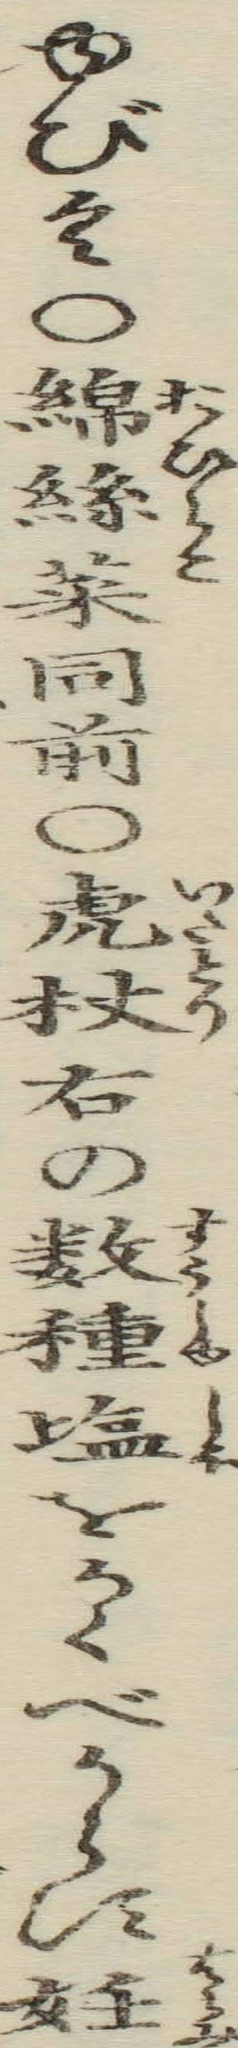ゆびく○綿絲菜同前○虎杖右の数種塩をかくべからす妊
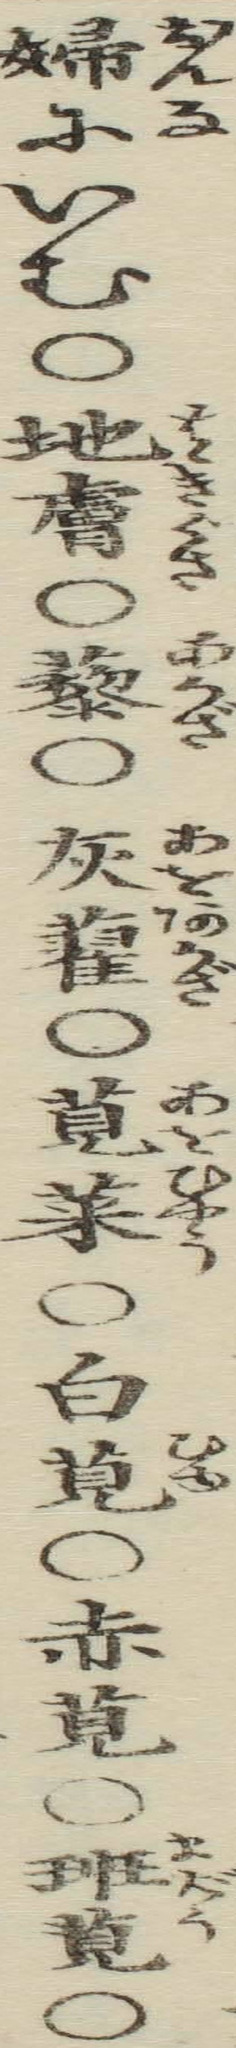婦にいむ○地膚○藜○灰藋○莧菜○白莧○赤莧○班莧○
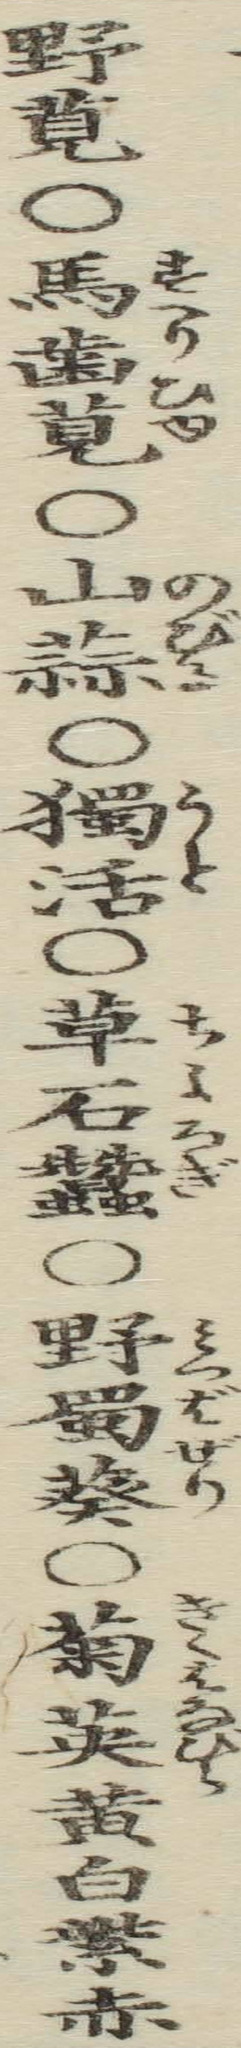野莧○馬歯莧○山蒜○独活○草石蠶○野蜀葵○菊英黄白紫赤
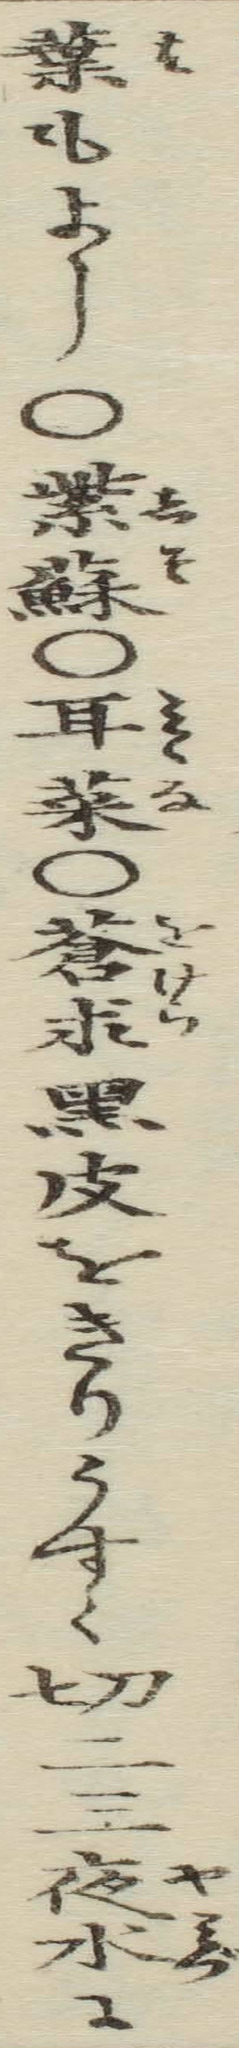葉もよし○紫蘇○耳菜○蒼求黒皮をきりうすく切二三夜水に
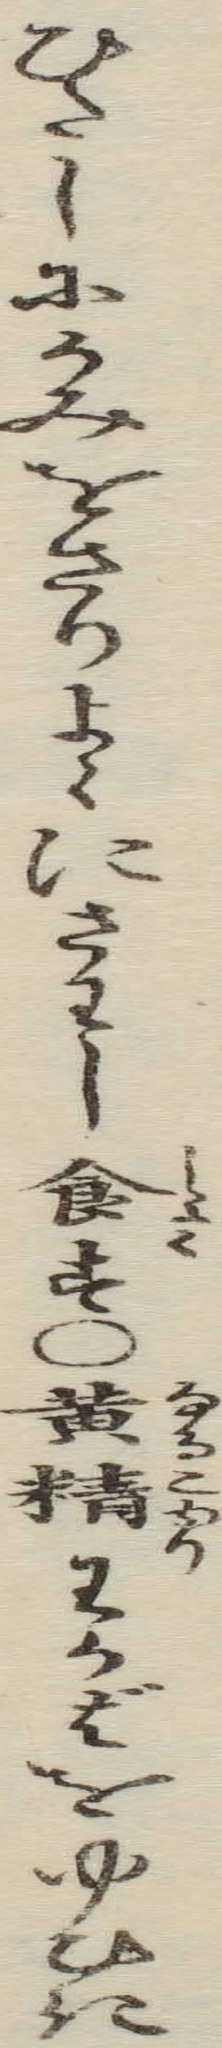ひたしにかみをさりよくにさわし食す○黄精わかばをゆひき
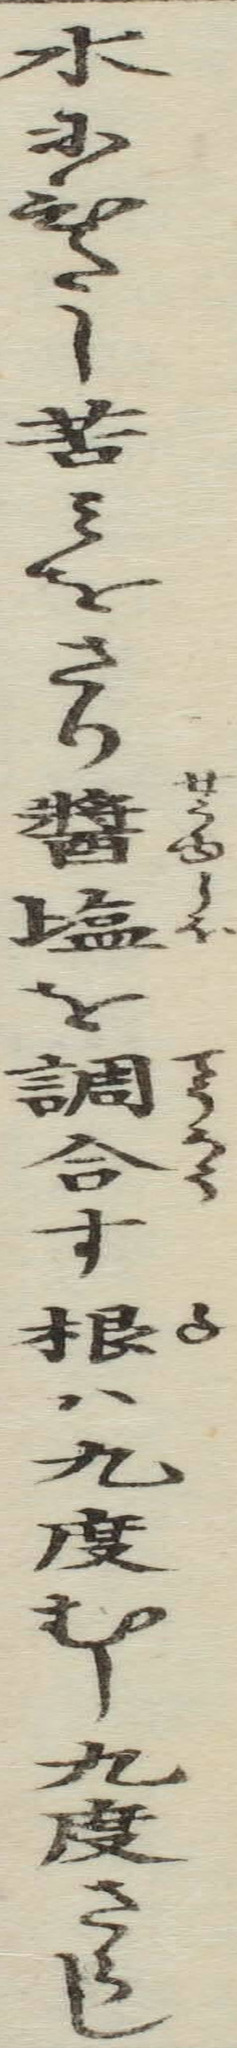水にひたし苦みをさり醤塩を調合す根は九度むし九度さらし
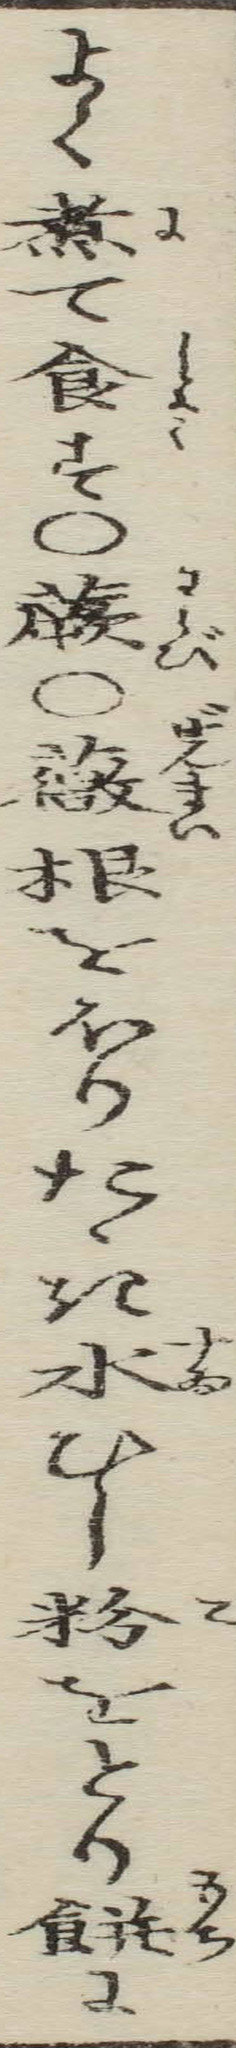よく煮て食す○蕨○薇根をほりたゝき水ひし粉をとり餅に
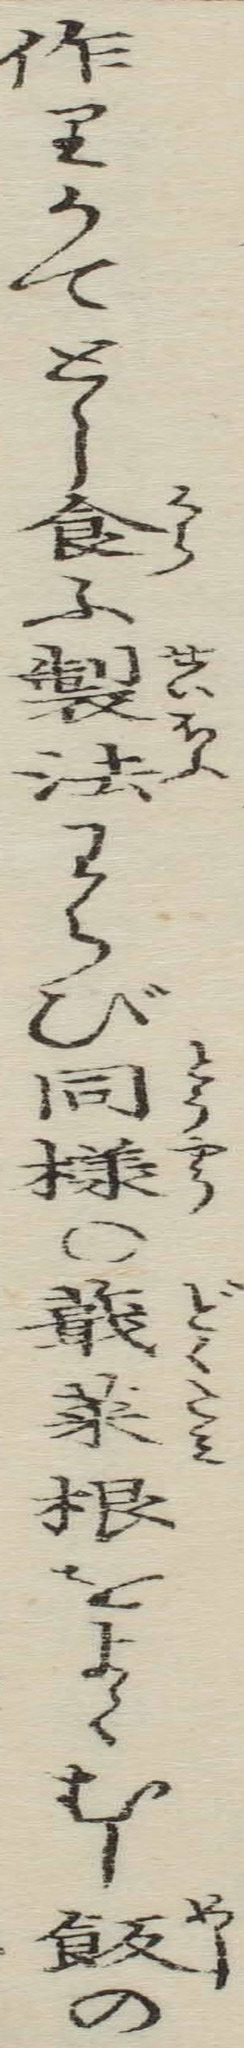作りかてとし食ふ製法わらび同様○蕺菜根をよくむし飯の
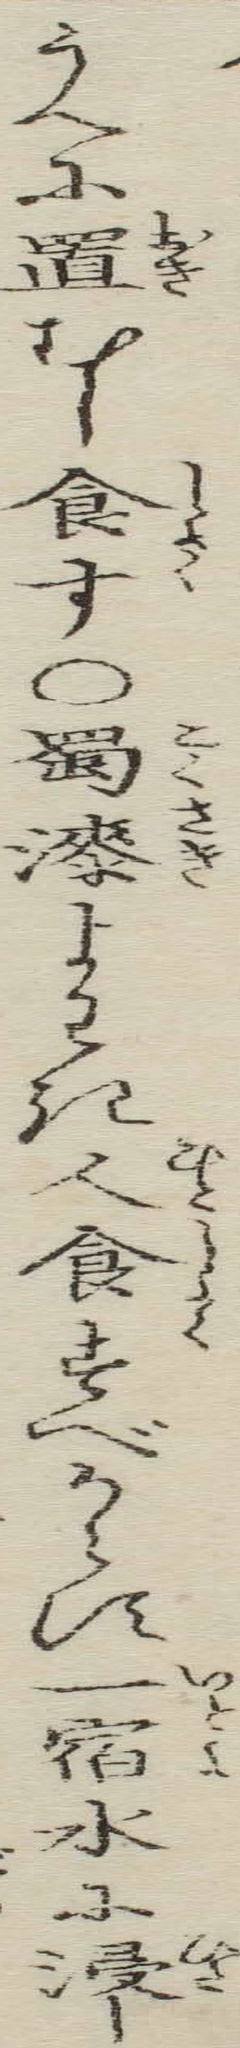うへに置むし食す○蜀漆よわき人食すべからす一宿水に浸し
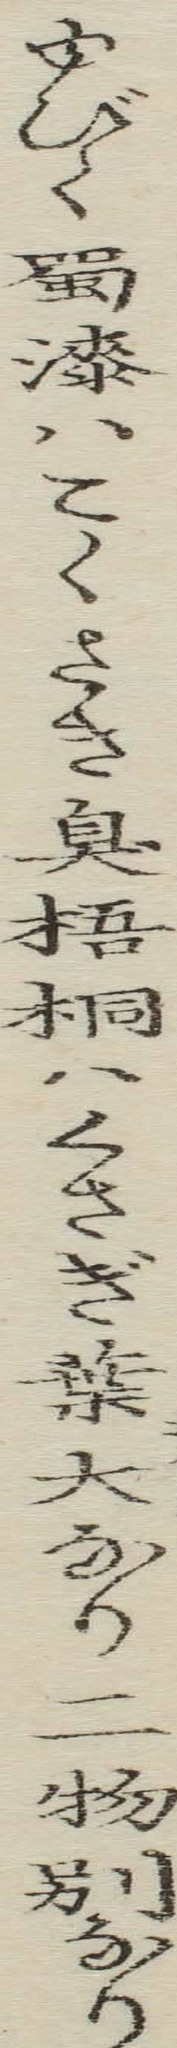ゆびく蜀漆はこくさき臭梧桐はくさぎ葉大なり二物別なり
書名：救荒便覧
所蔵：国文学研究資料館
